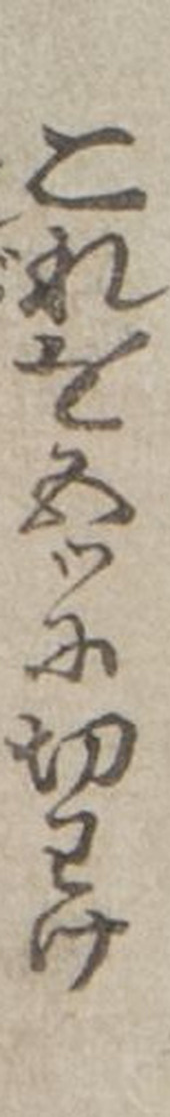これを五つに切わけ
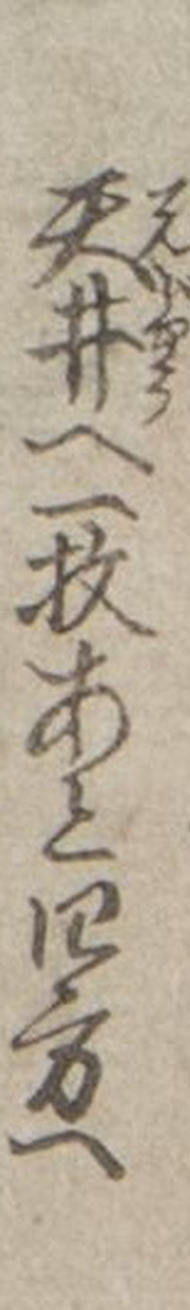天井へ一まい枚あと四方へ
